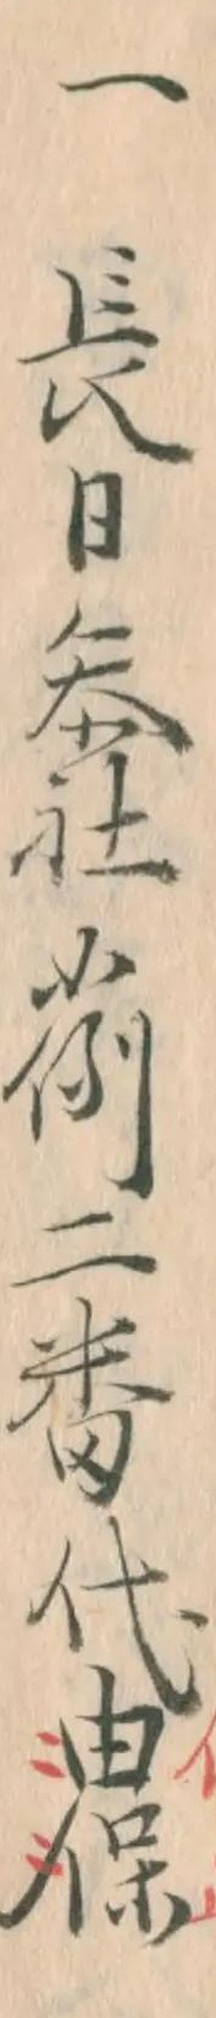一長日参社如例二番代由保
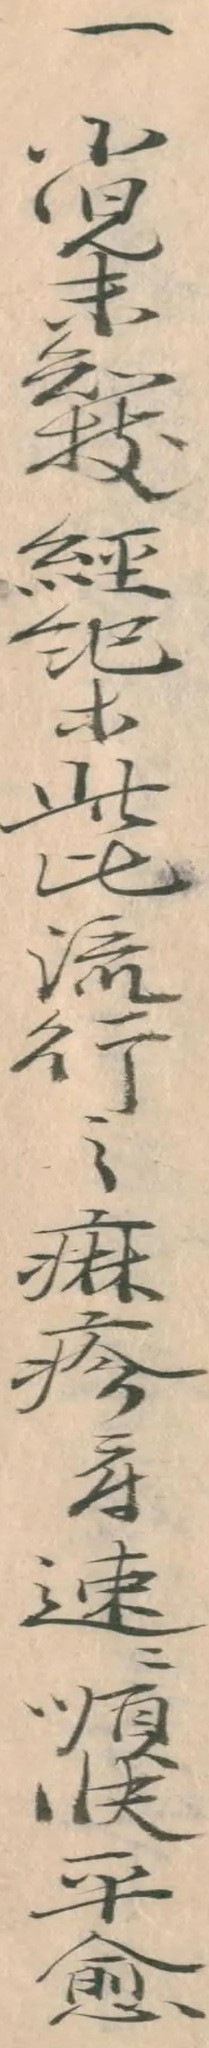一小児未知経紀等此比流行之麻疹ニ付速ニ順快平愈
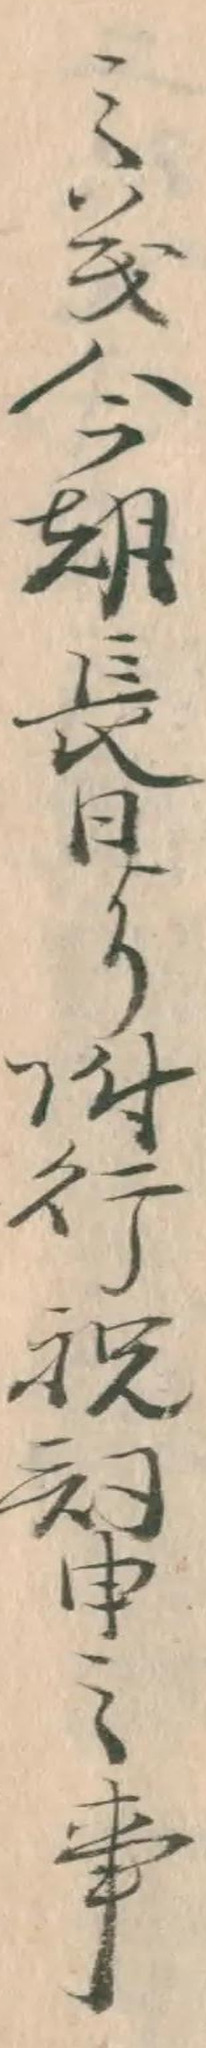之義今朝長日より附行祝詞申之事
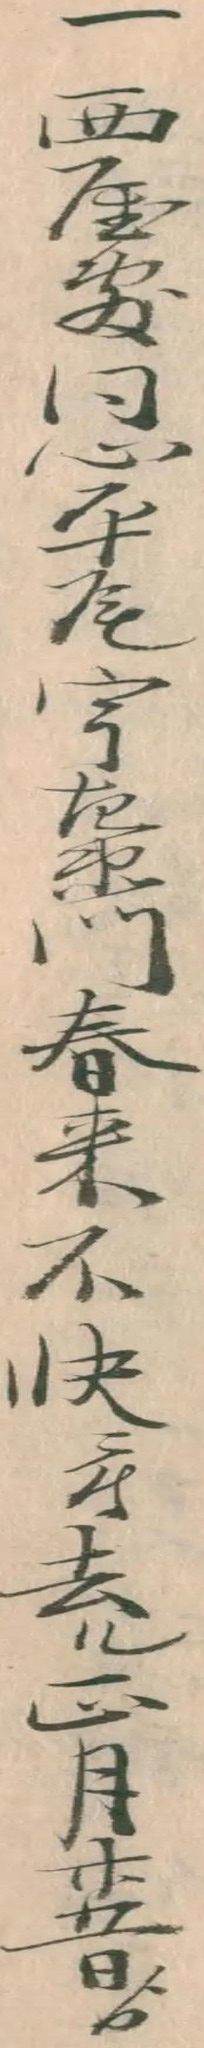一西屋敷同心平尾宇左衛門春来不快ニ付去ル正月廿五日ゟ
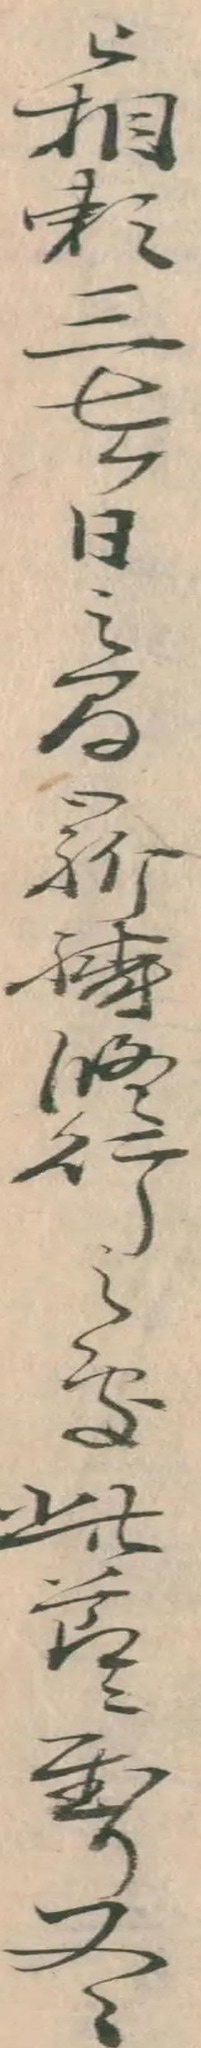被相頼三七ケ日之間御祈祷修行之處此節ニ至り又々
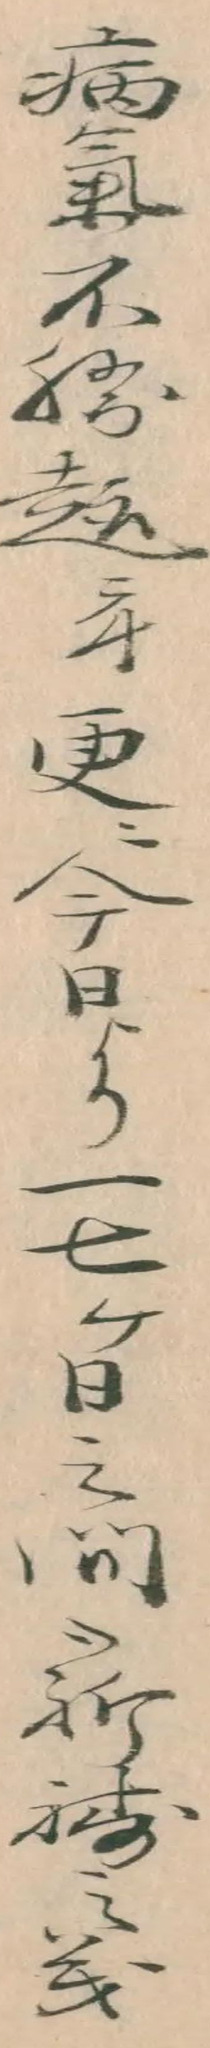病氣不勝趣ニ付更ニ今日より一七ケ日之間御祈祷之義
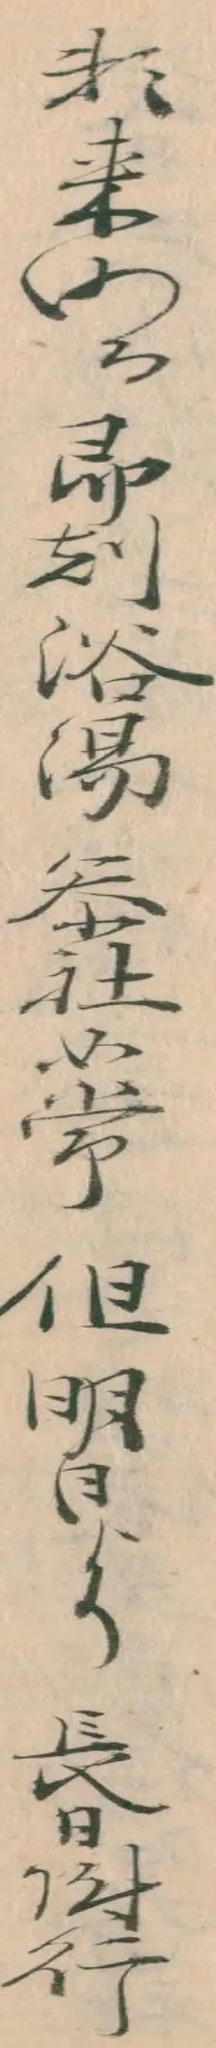頼来仍而即刻浴湯参社如常但明日より長日附行
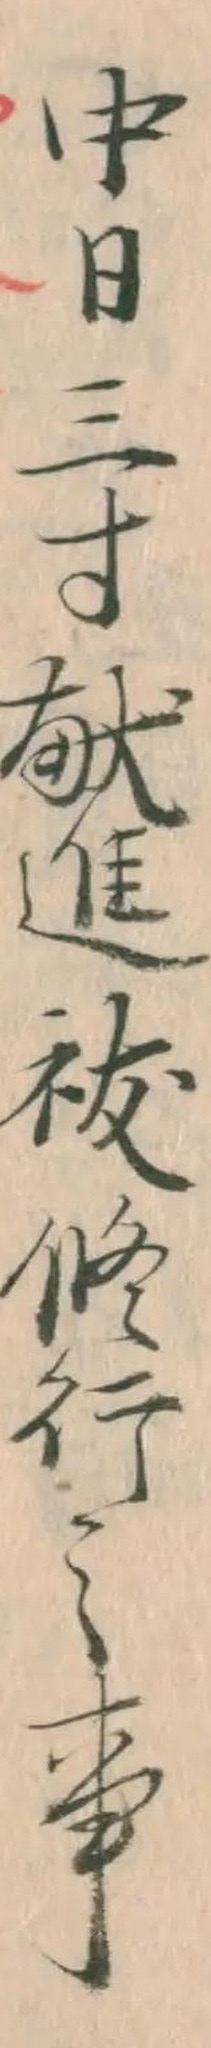中日三寸献進祓修行之事
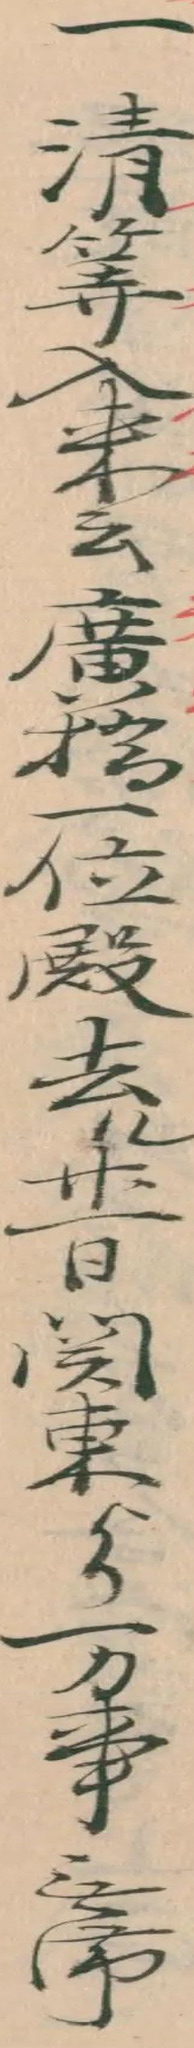一清算入来云廣橋一位殿去ル廿一日関東より万事無滞
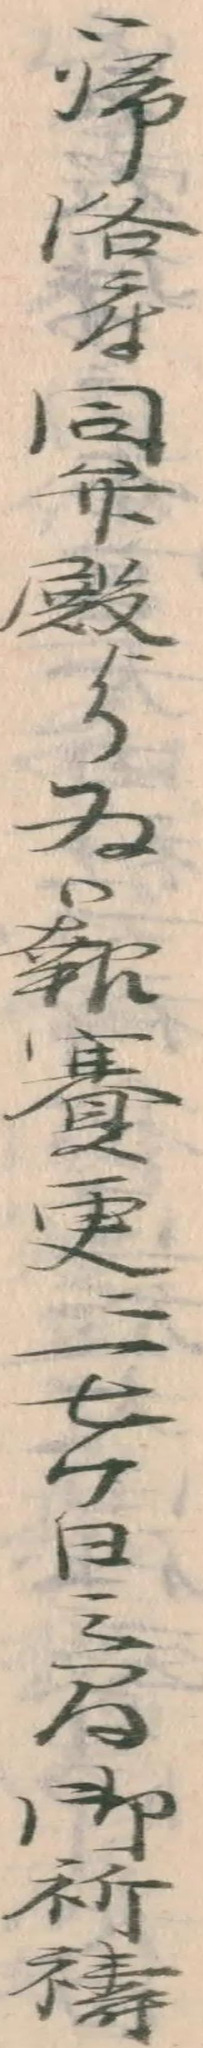御帰洛ニ付同弁殿より為御報賽更ニ一七ケ日之間御祈祷
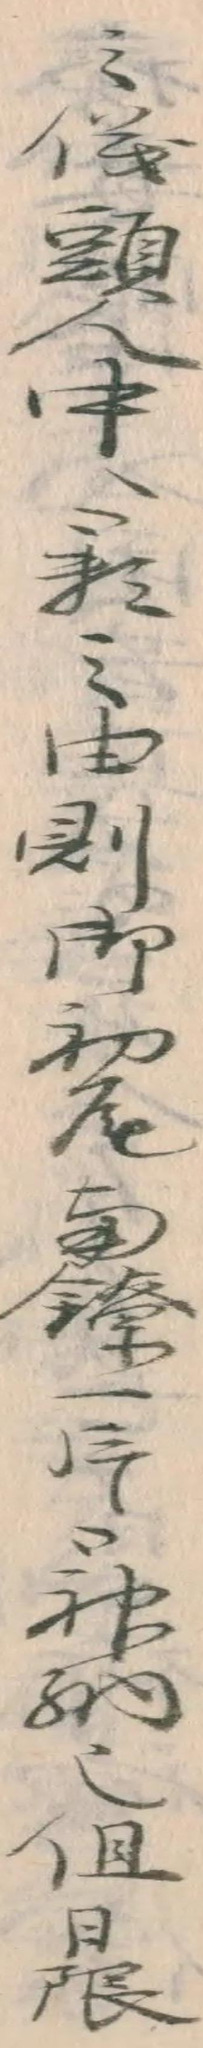之儀頭人中へ御頼之由則御初座南鐐一片御神納也但日限
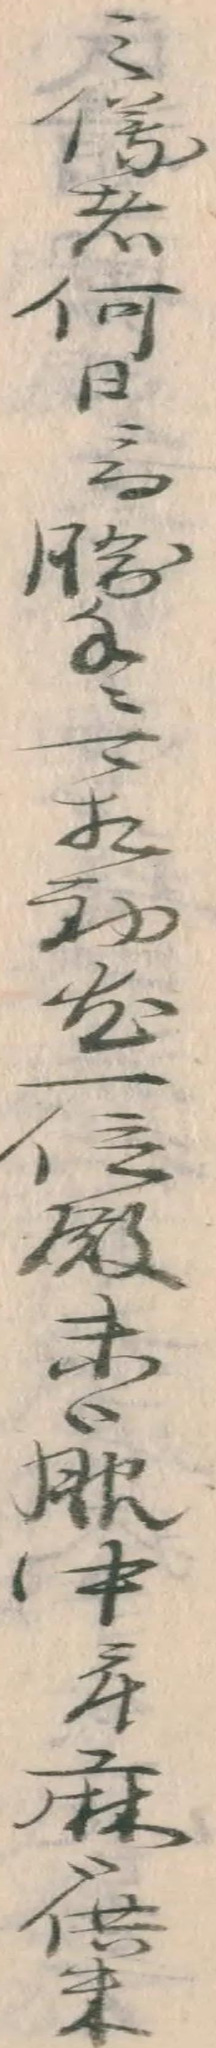之儀は何日ニ而勝手ニ可相勤尤一位殿未御服中ニ付麻御供米
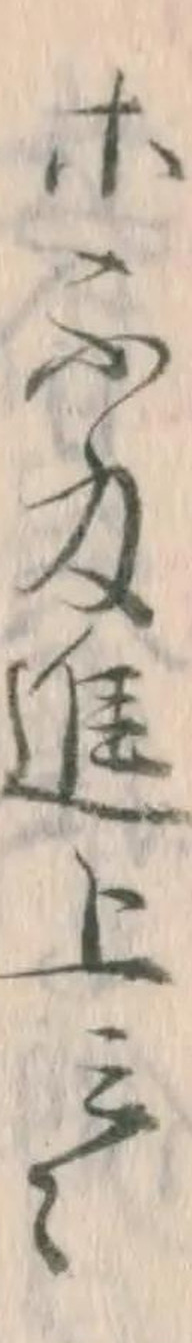等不及進上云〻
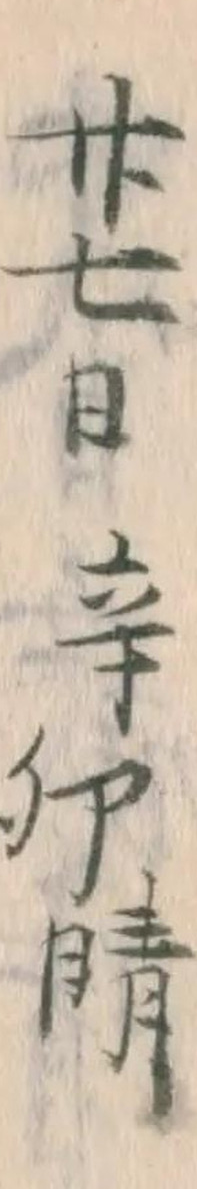廿七日辛卯晴
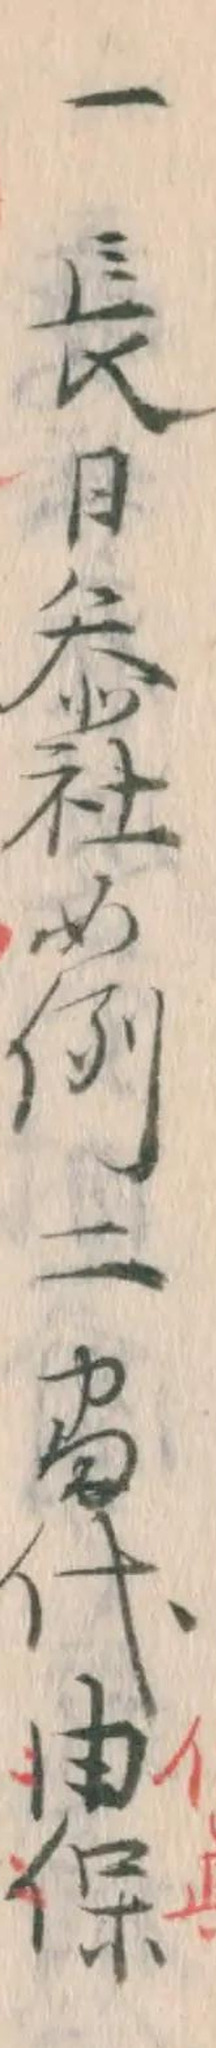一長日参社如例二番代由保
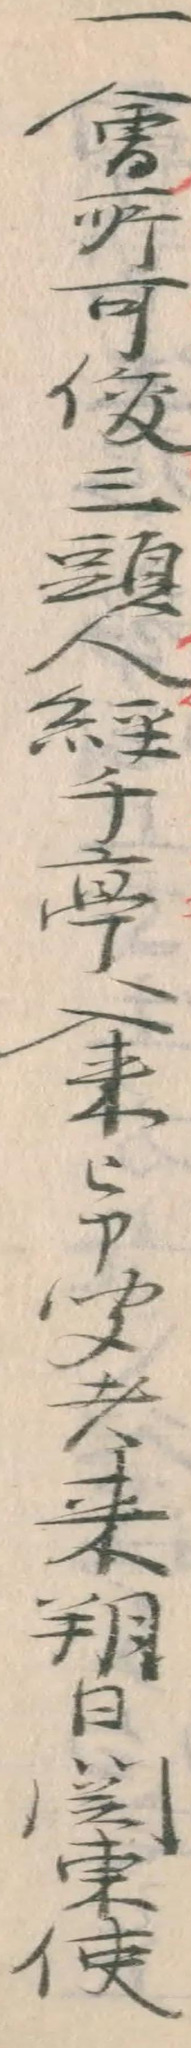一會所可俊三頭人経千亭へ入来被申聞者来朔日関東使
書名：賀茂社記録. 第73冊
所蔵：国立国会図書館 National Diet Library, JAPAN
